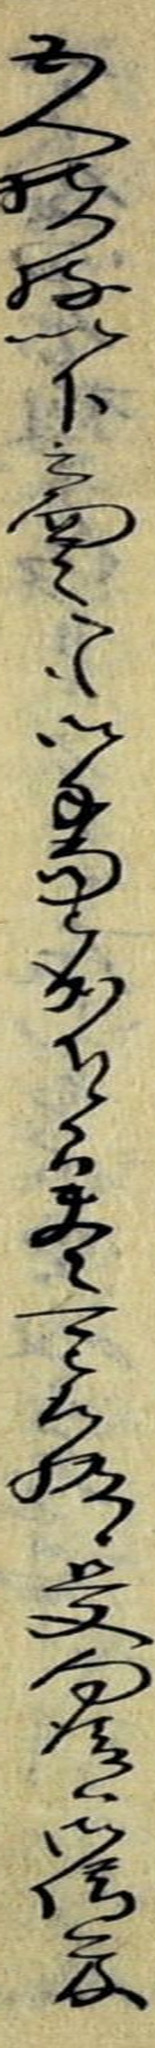五人扶持以下之面々へも御手当被成下候間夫々可被取扱候且又向後ハ御借米
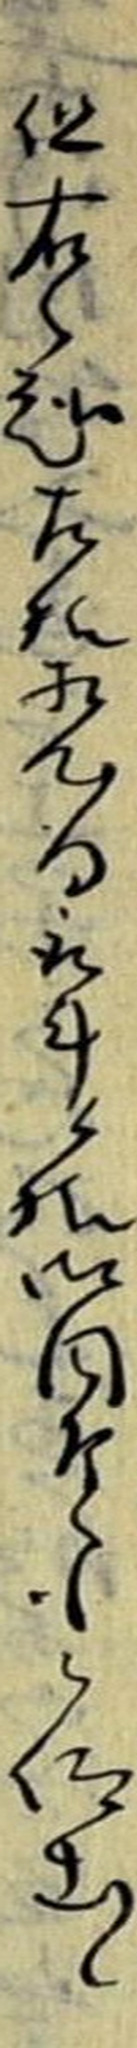但右之趣左様相心得取計候様御目付へも被仰出候
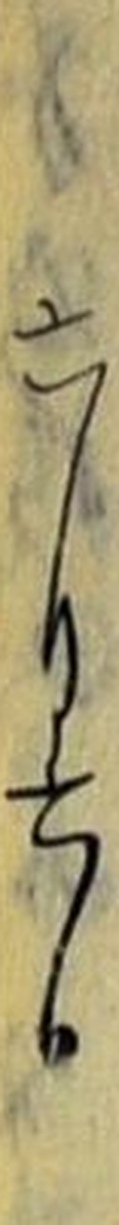六月六日
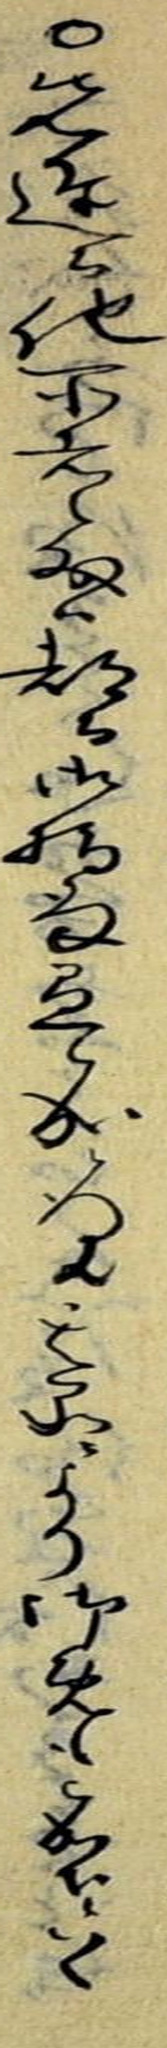〇先達而他所者之義ハ都而御指留置之義候得共其品ニより御免も被成下候ハヽ
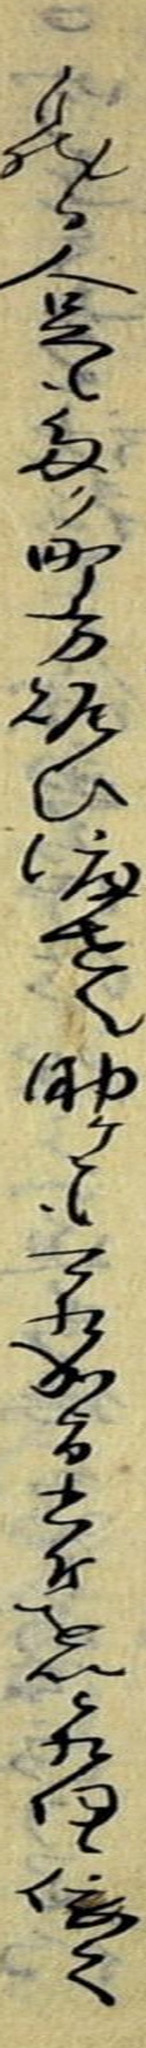自然与人足も多ク町方賑ひ渡世之助ケニも可相成旨書付を以被相伺候依之
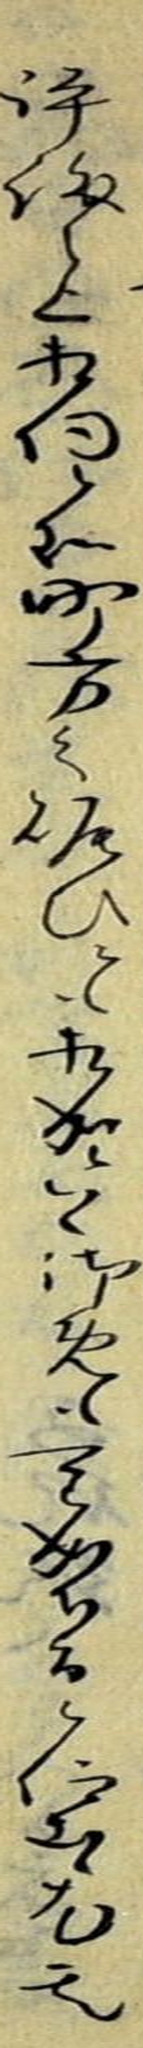評議之上相伺候処町方之賑ひニも相成候ハヽ御免も可被成下旨被仰出候尤其
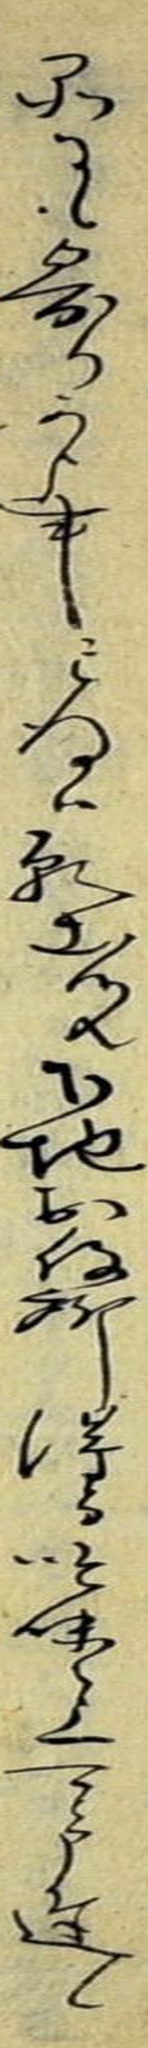品にも寄り可申事ニ候得ハ願出候共下地於役所得与吟味之上可被申達候
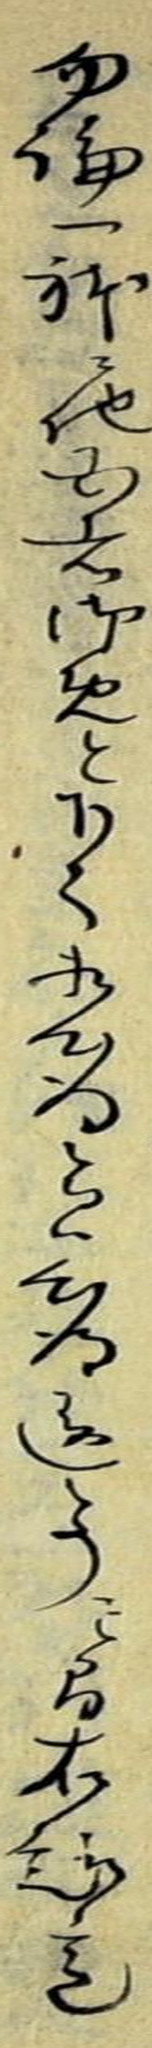勿論一体ニ他国者御免と下々相心得候而ハ心得違之事ニ候間右趣意
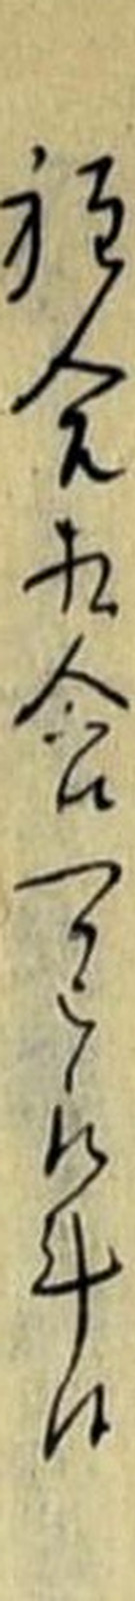程合相含可被取計候
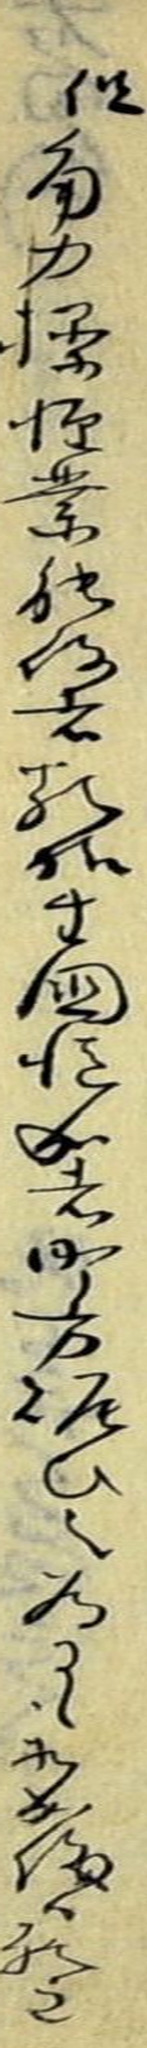但角力操軽業能役者類様生国慥成者町方賑ひ之為にも相成儀ハ願主
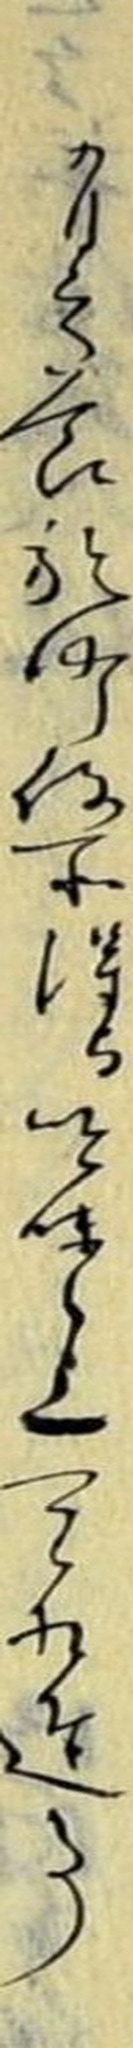有之節於町役所得与吟味之上可被相達事
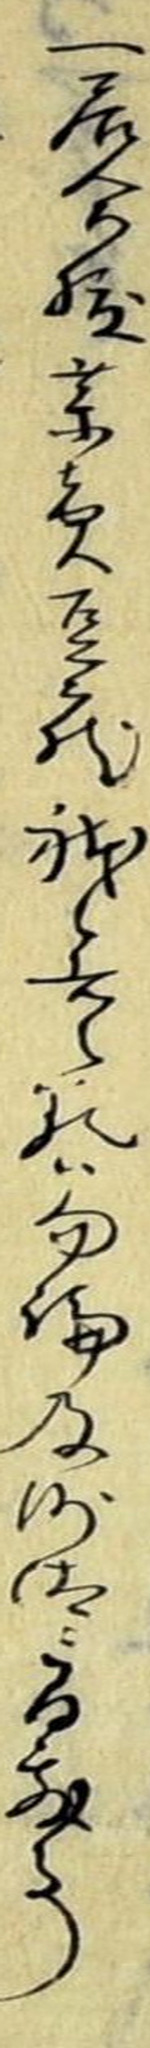一居合抜薬売豆蔵体候者之類ハ勿論及沙汰ニ間敷事
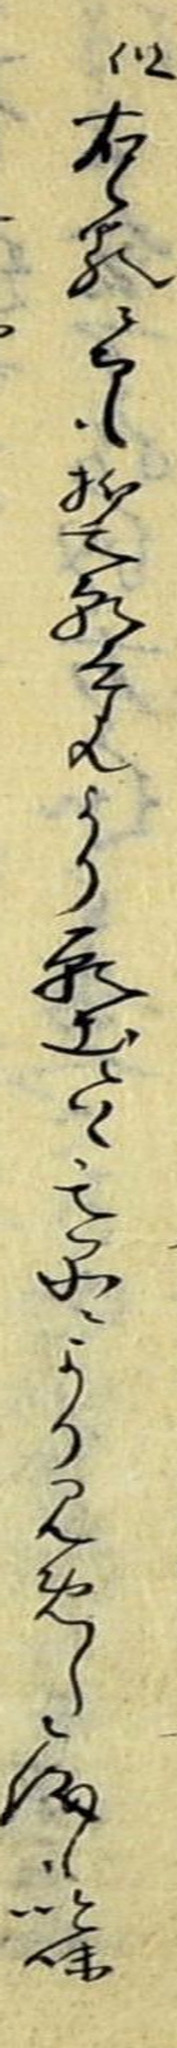但右之類ニ而も誓願寺共より願出候ハヽ其品ニより見免し候儀も吟味
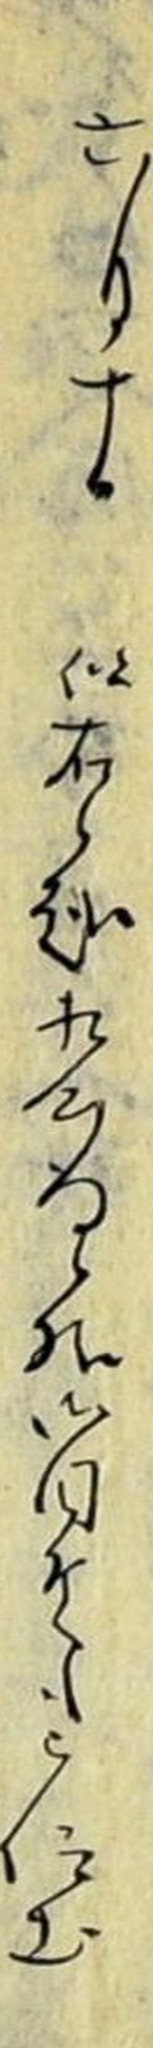六月十日但右之趣相心得候様御目付へも被仰出
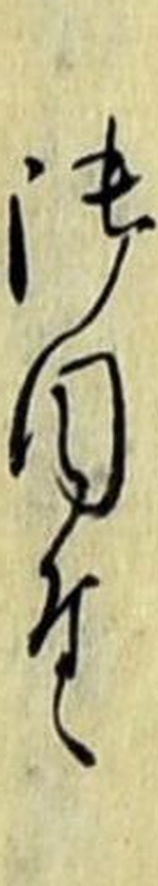御目付へ
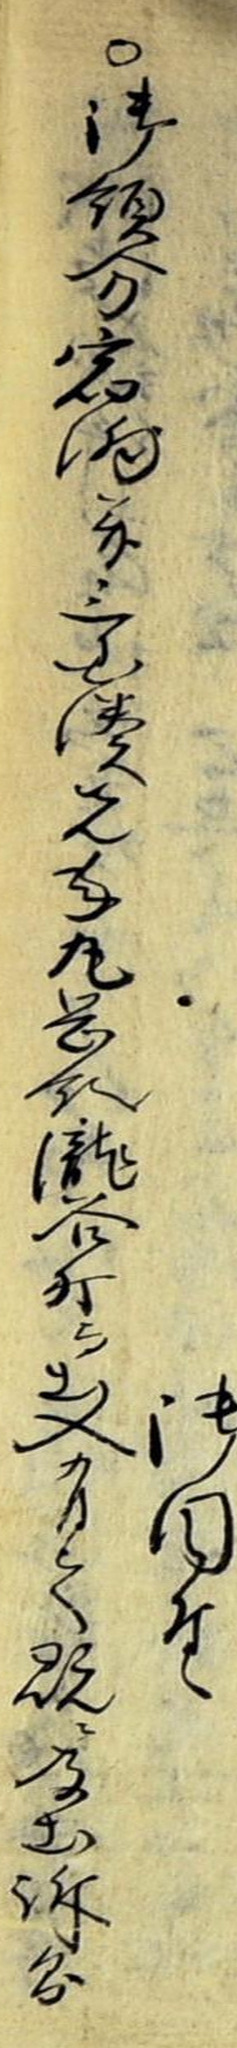〇御領分宿浦并三国湊先年丸岡領瀧谷町与出入有之既ニ及出訴則
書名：命令之部 三
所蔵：福井県文書館 Fukui Prefectural Archives
